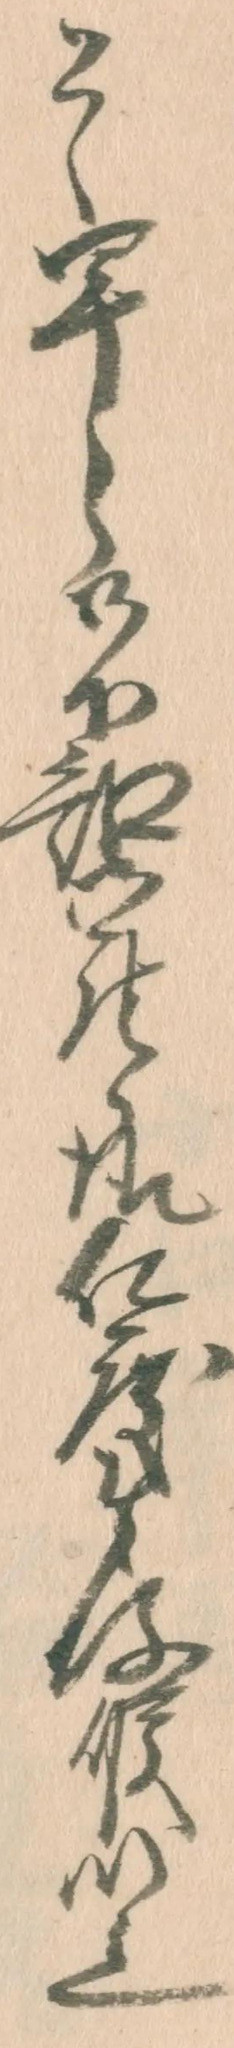候ハヽ早〻御下知御座候様仕度奉存候以上
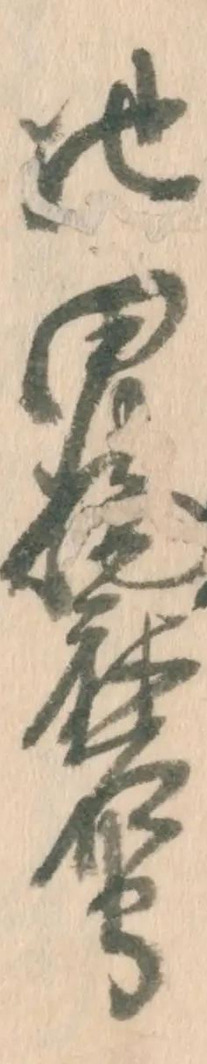池田播磨守

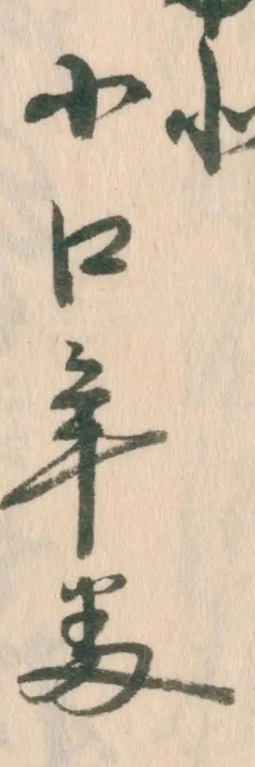小口年番
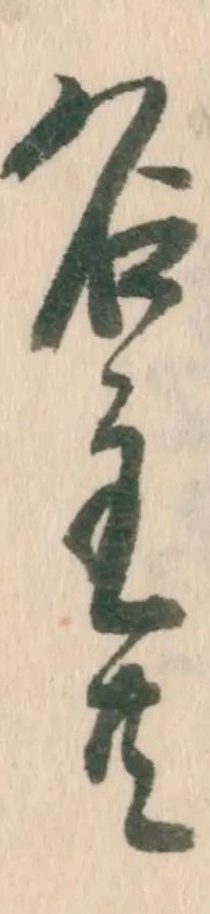名主共
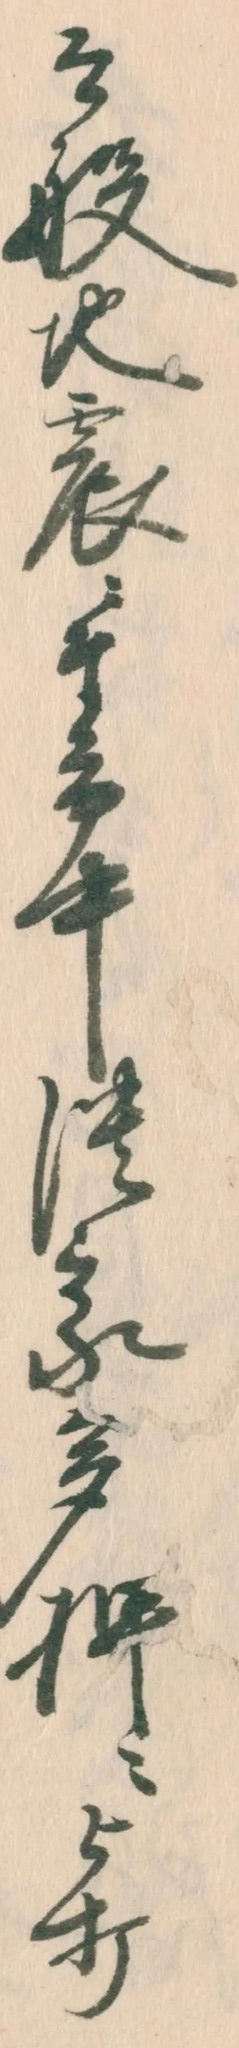今般地震ニ付市中潰家多く摧ニ被打
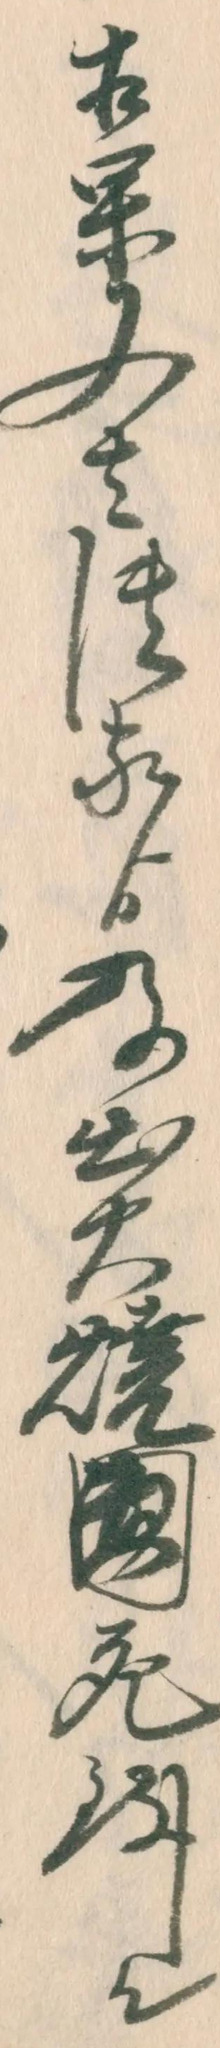相果又は潰家ゟ及出火焼死致し候
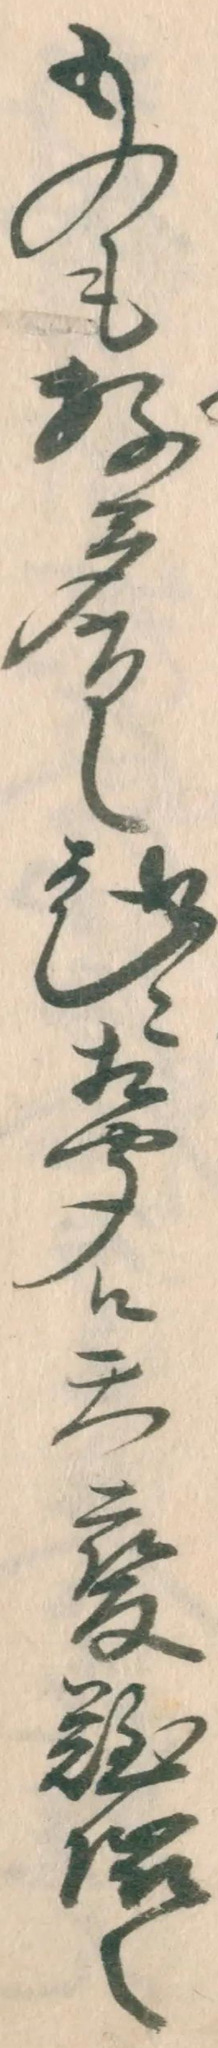ものも数多有之趣ニ相聞候天変難渋之

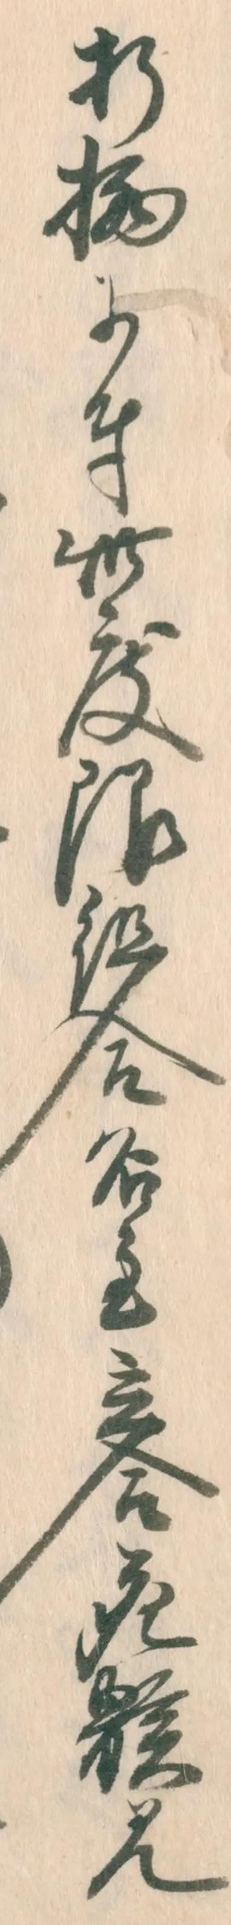折柄に付此度限組合名主立合死骸見
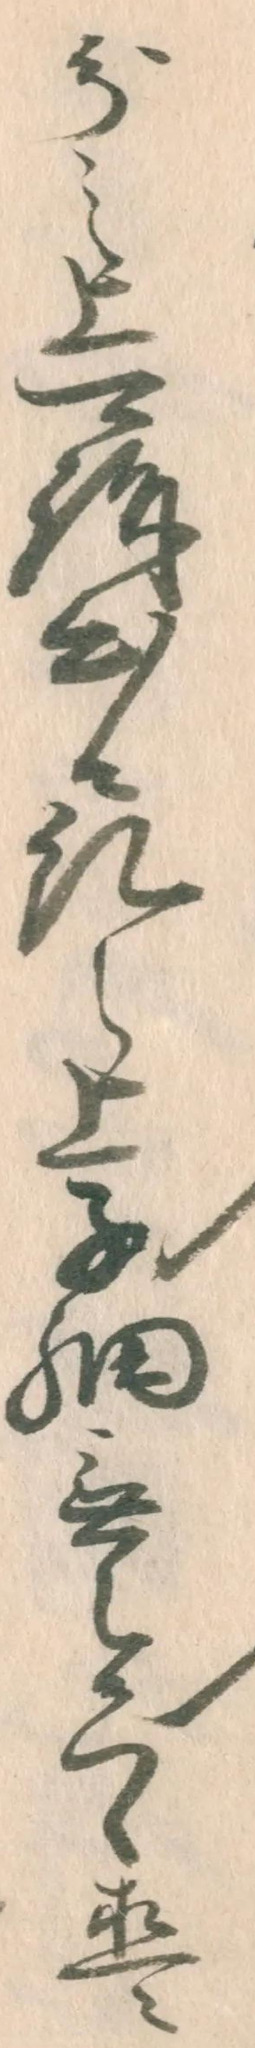分之上可訴出候糺之上子細無之候ハヽ直ニ
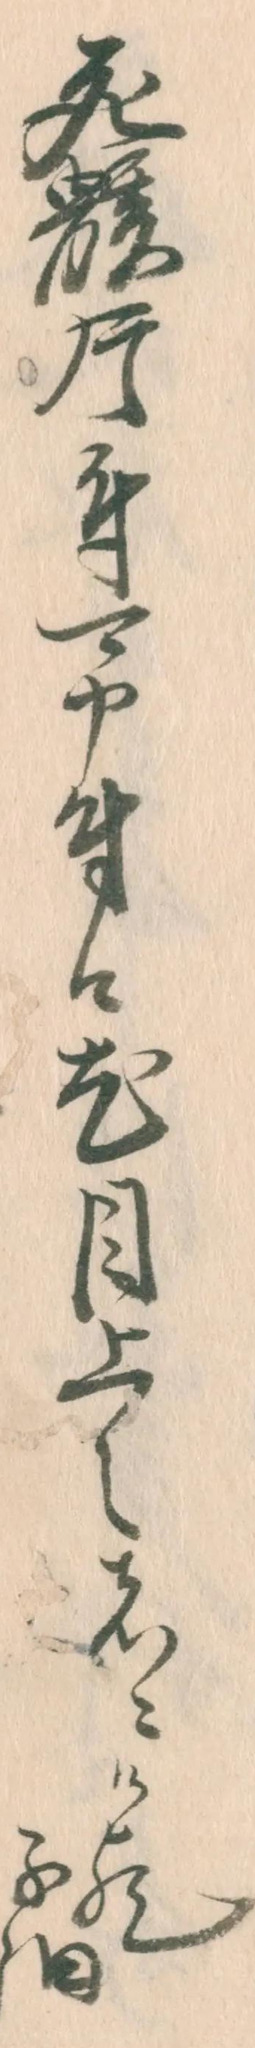死骸片付可申付候尤目上之者ニ候歟子細
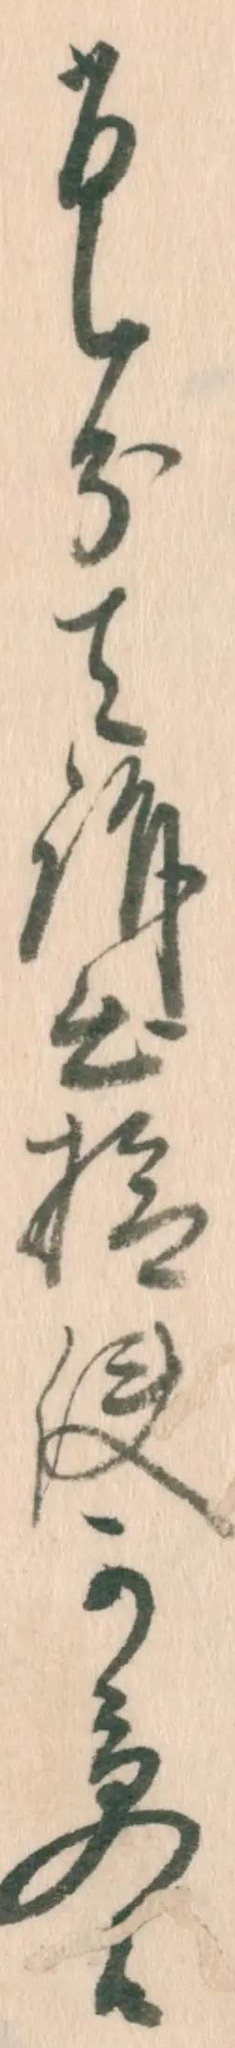有之分は訴出検使可受候
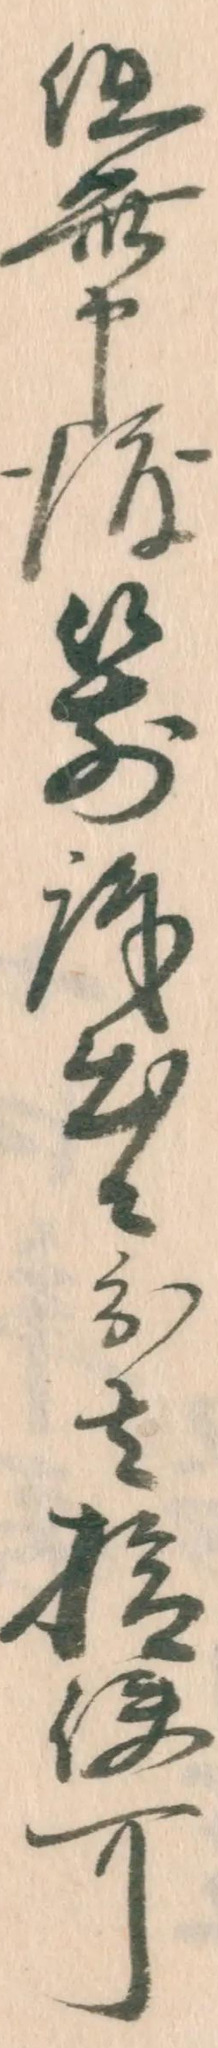但此申渡以前訴出候分は検使可
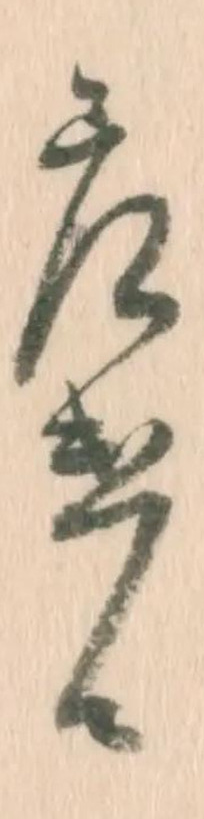差遣候
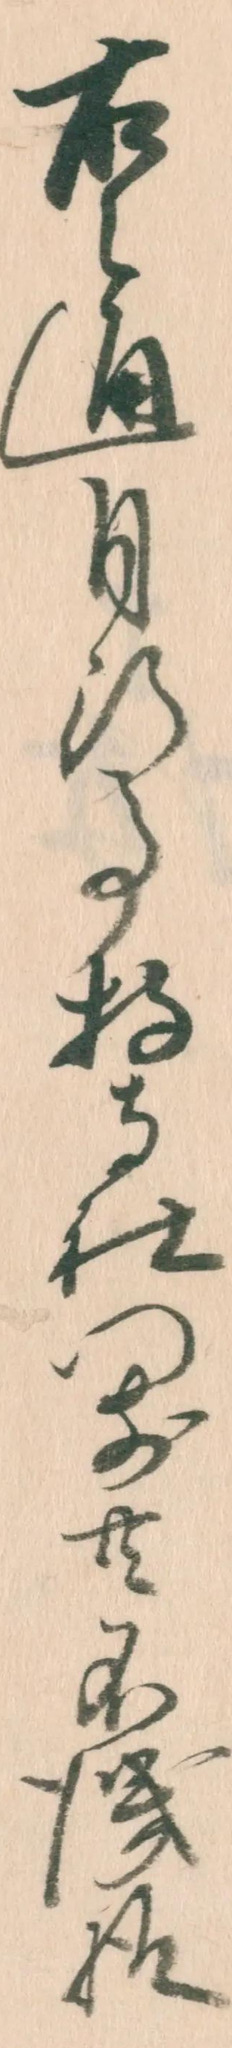右之通月行事持寺社門前共不洩様
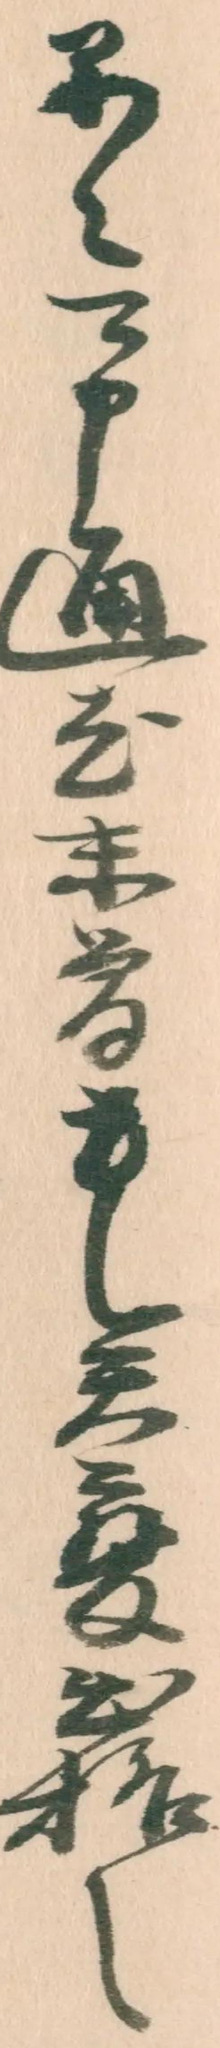早〻可申通尤未曽有之天変出格之
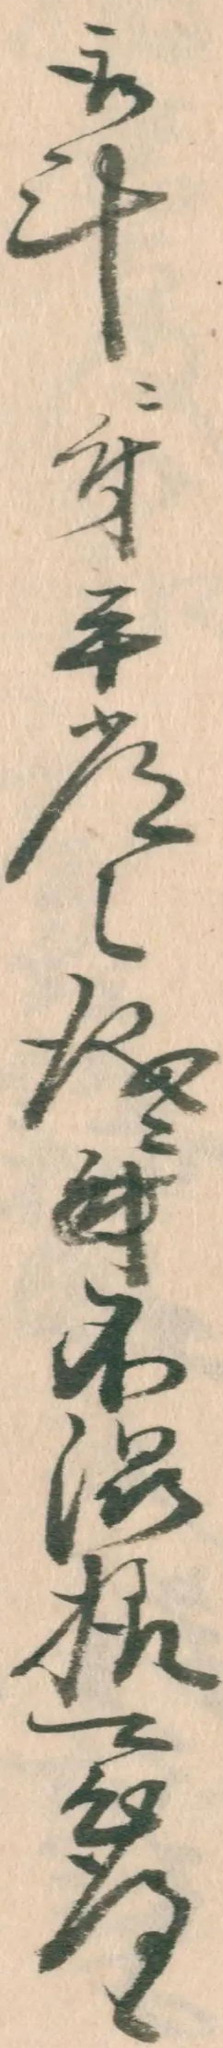取計ニ付平常之儀ニ不混様可心得候
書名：地震災書留 2巻. [2] 内表紙に「地震一件　安政二卯年十月」とあり
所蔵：国立国会図書館 National Diet Library, JAPAN
